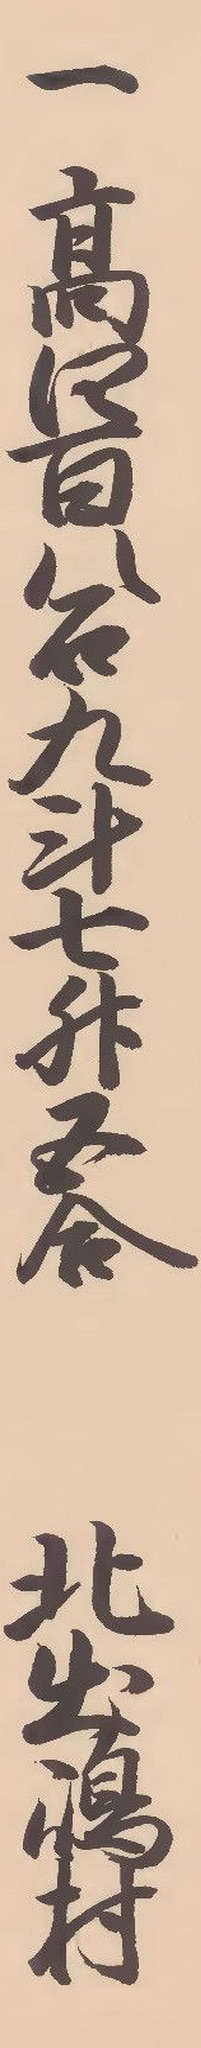一高四百八石九斗七升五合北出島村
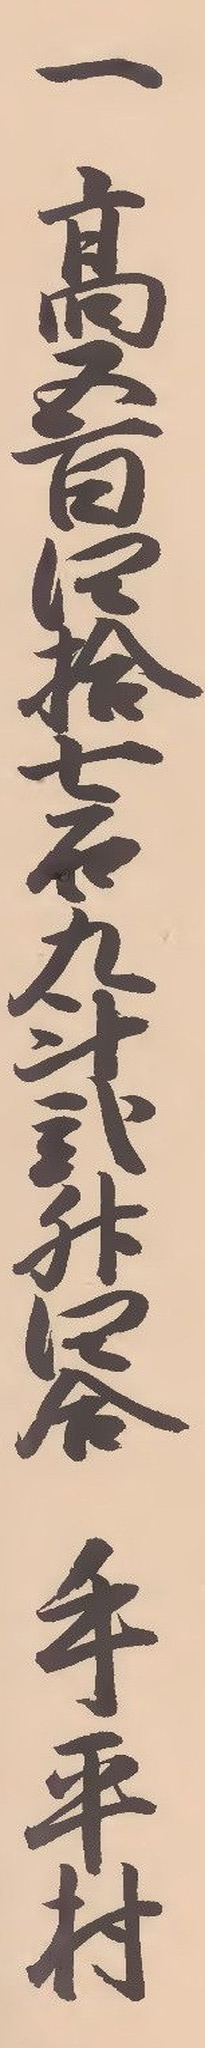一高五百四拾七石九斗弐升四合手平村
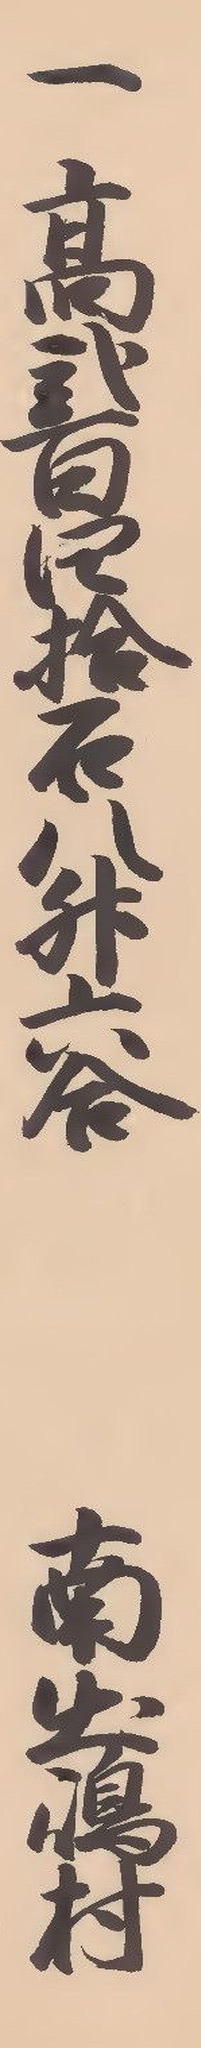一高弐百四拾石八升六合南出島村
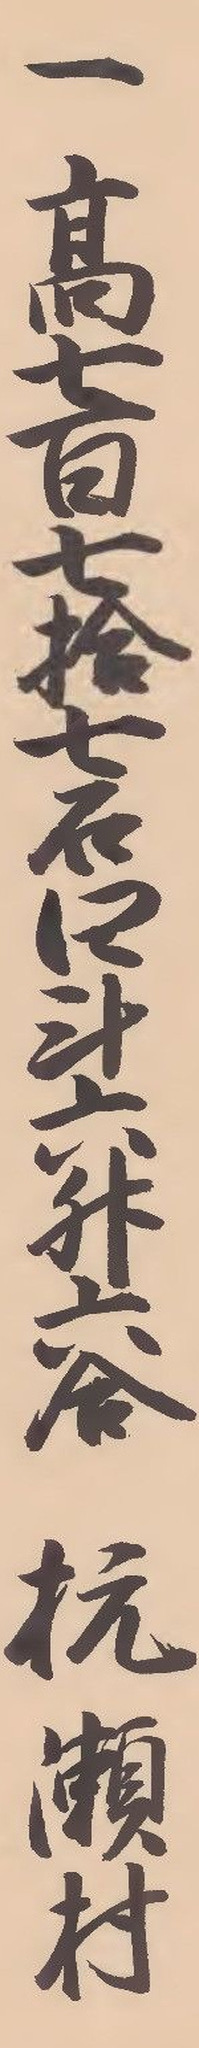一高七百七拾七石四斗六升六合杭瀬村
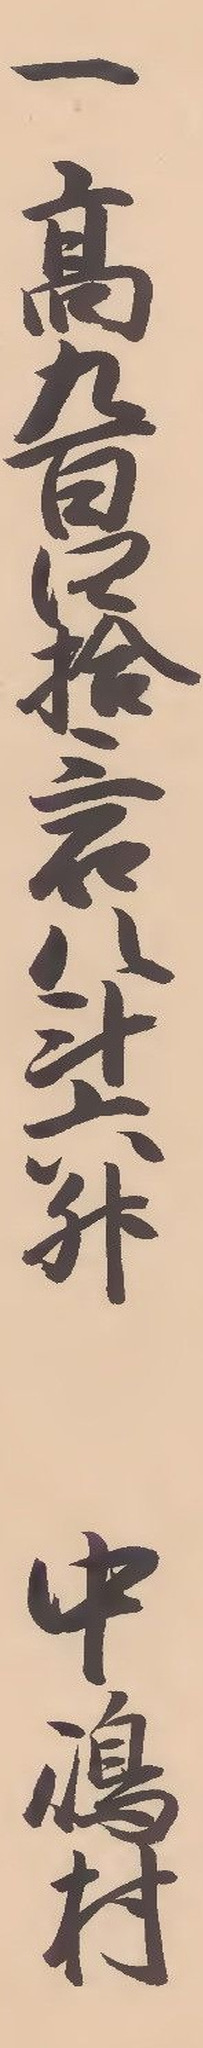一高九百四拾三石八斗六升中島村

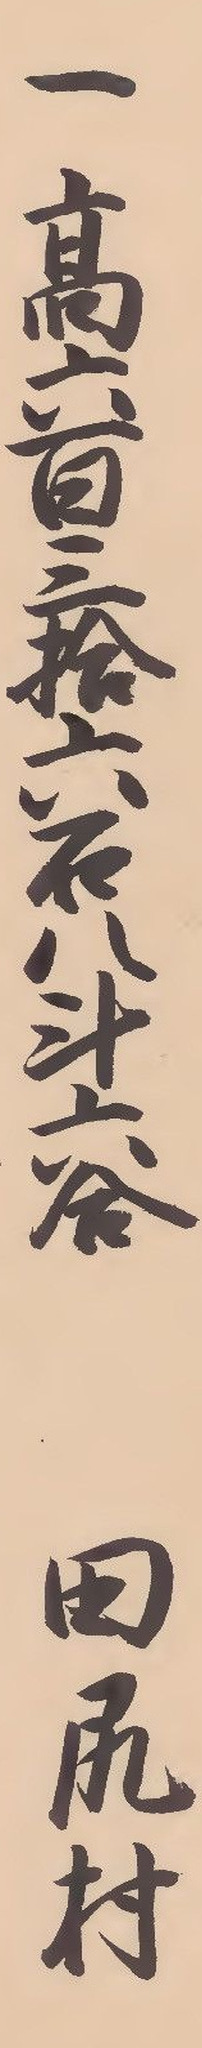一高六百三拾六石八斗六合田尻村
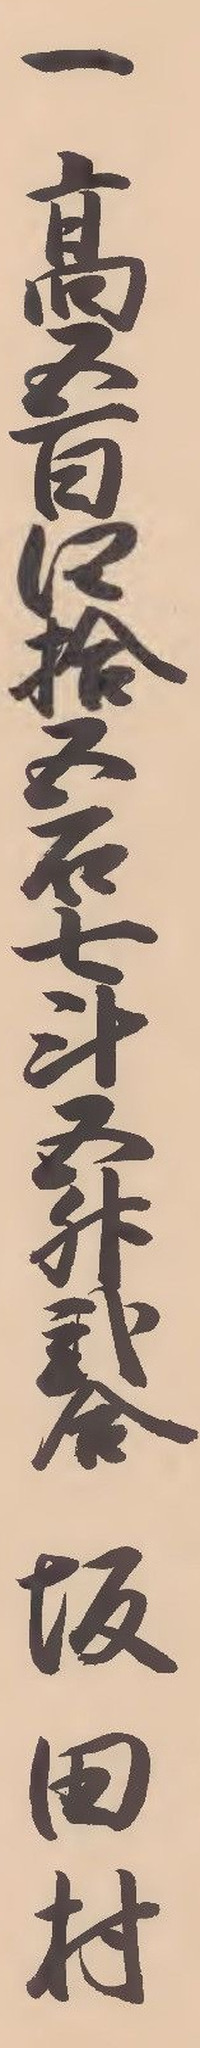一高五百四拾五石七斗五升弐合坂田村
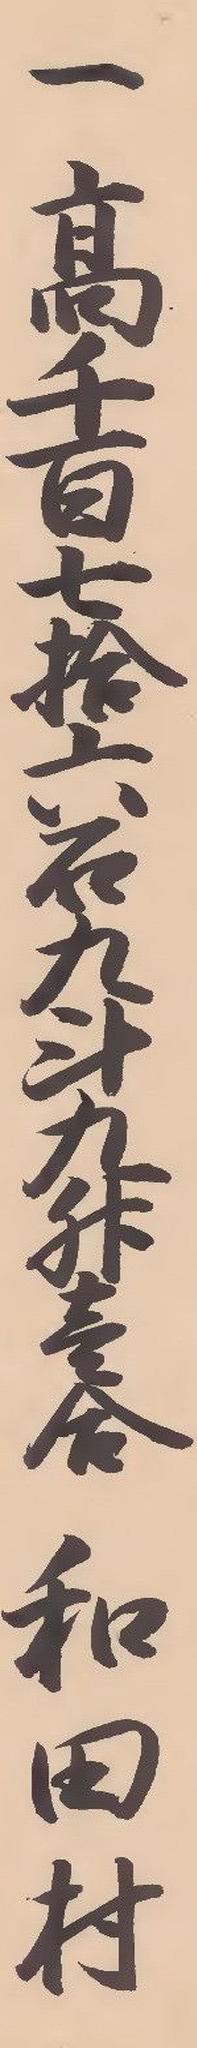一高千百七拾六石九斗九升壱合和田村
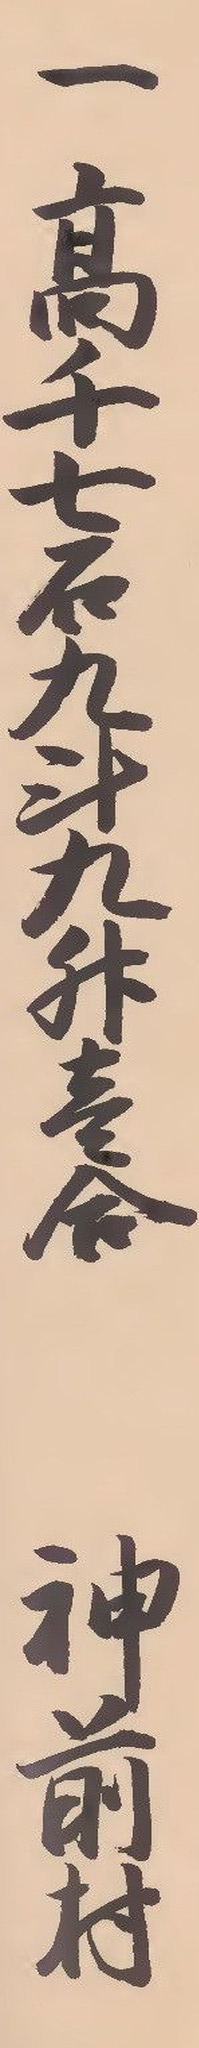一高千七石九斗九升壱合神前村
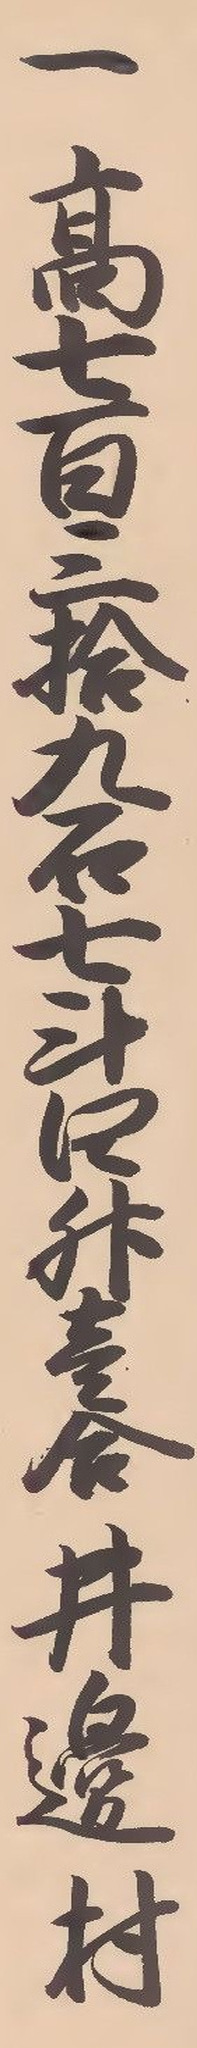一高七百三拾九石七斗四升壱合井辺村
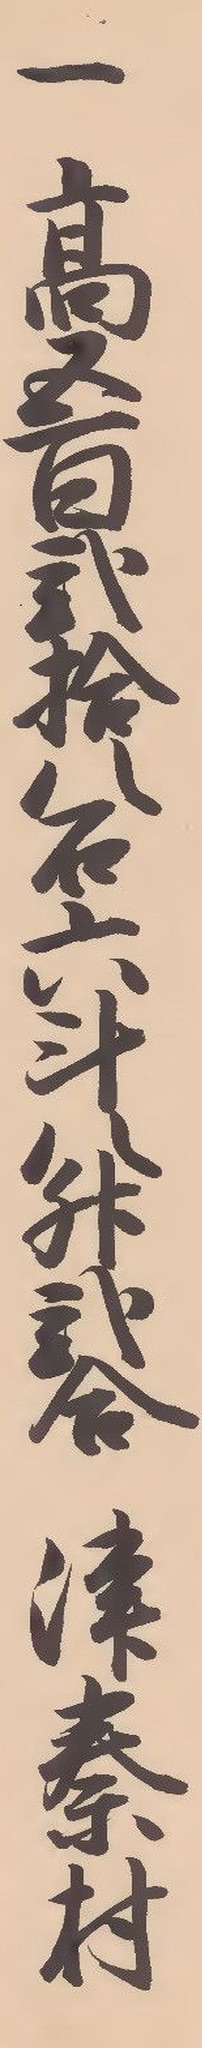一高五百弐拾八石六斗八升弐合津秦村
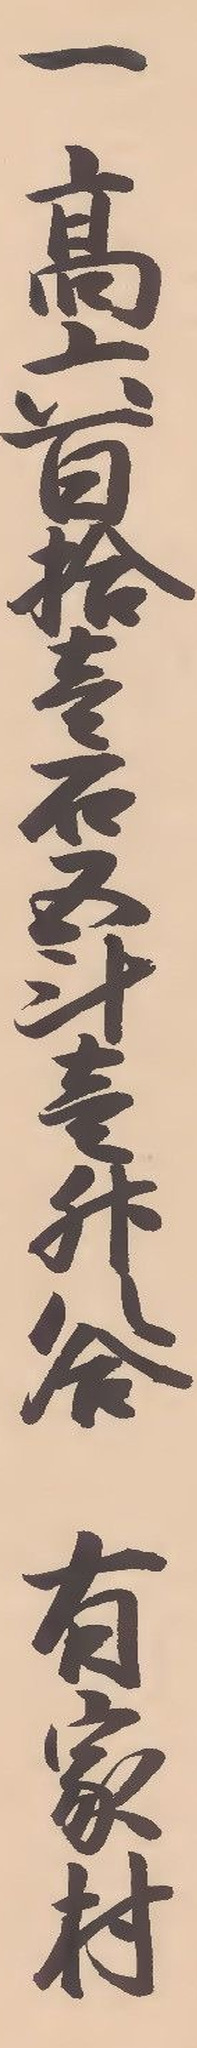一高六百拾壱石五斗壱升八合有家村
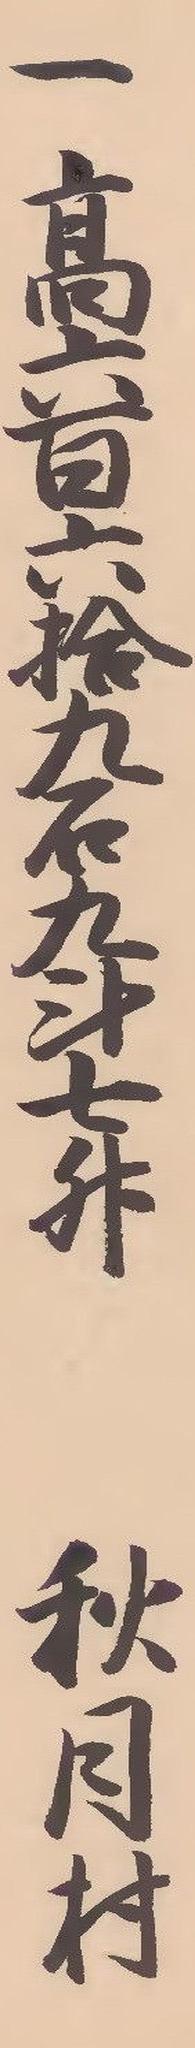一高六百六拾九石九斗七升秋月村

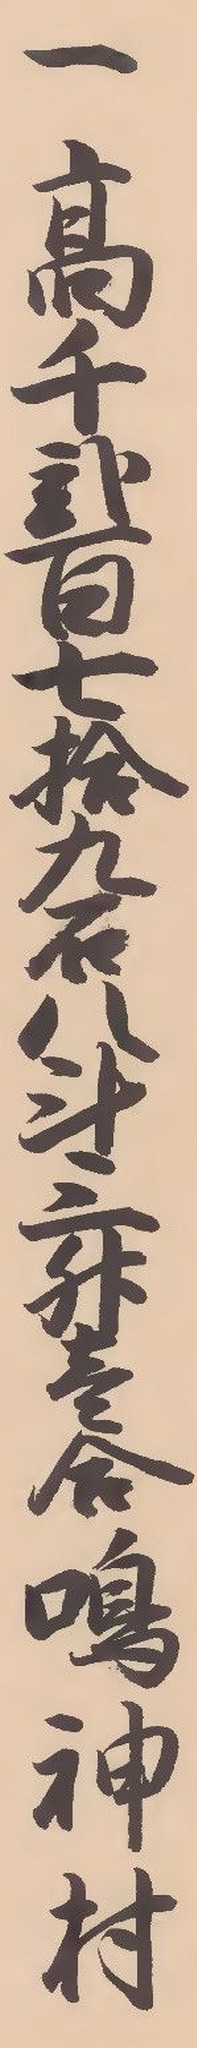一高千弐百七拾九石八斗三升壱合鳴神村
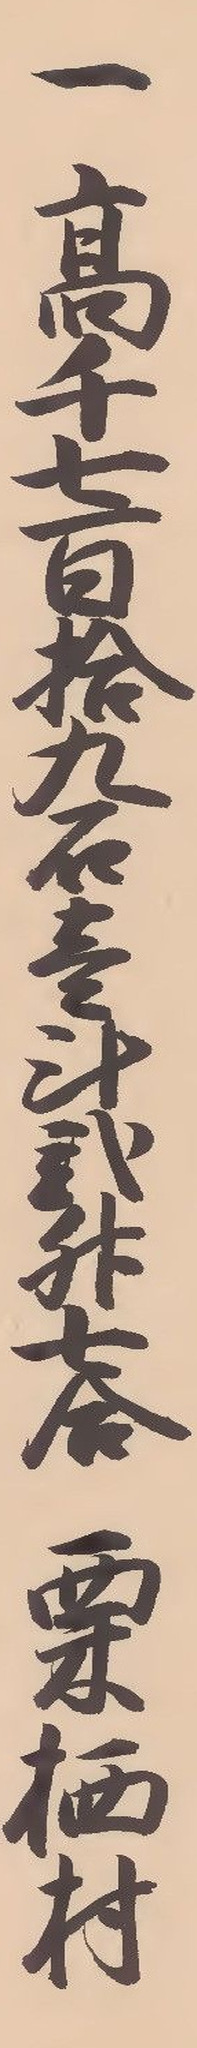一高千七百拾九石壱斗弐升七合栗栖村
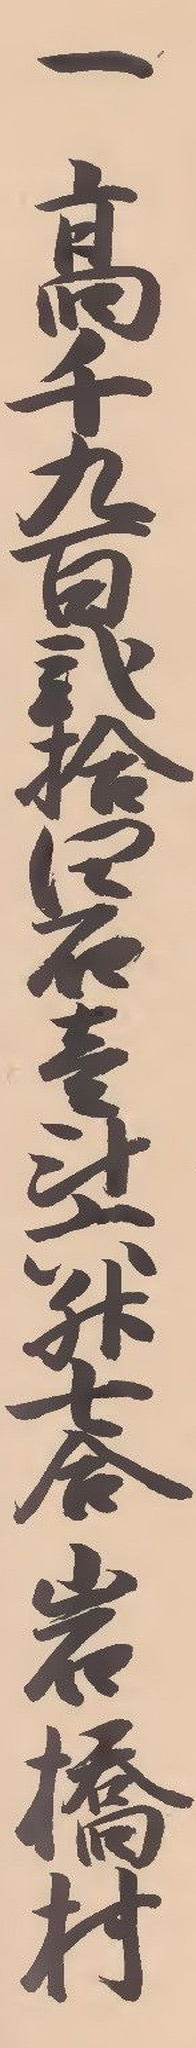一高千九百弐拾四石壱斗六升七合岩橋村
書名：紀伊国郷帳
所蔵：国立公文書館 National Archives of Japan
